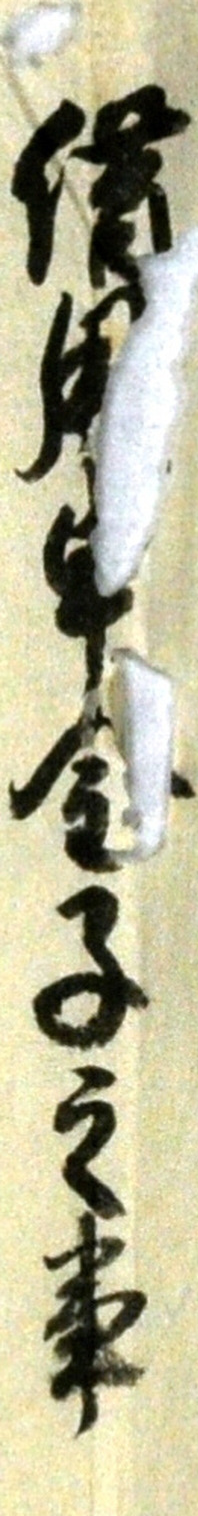借用申金子之事
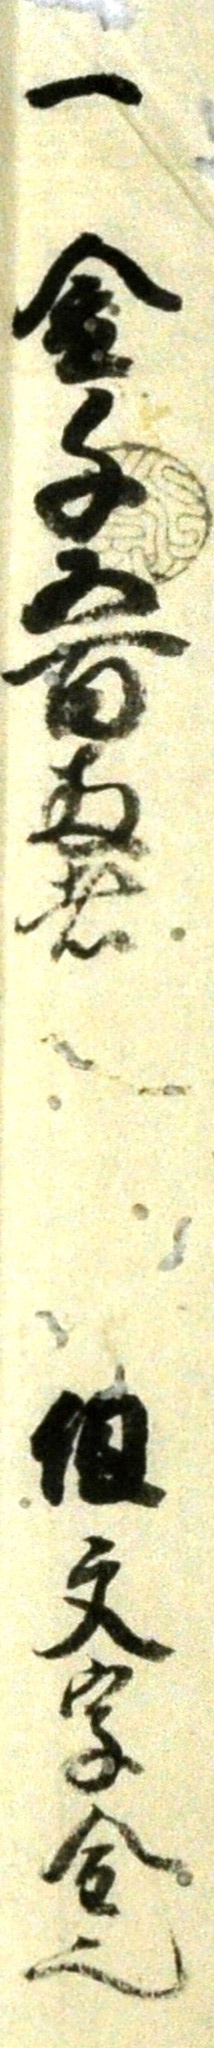一金千五百両者但文字金也
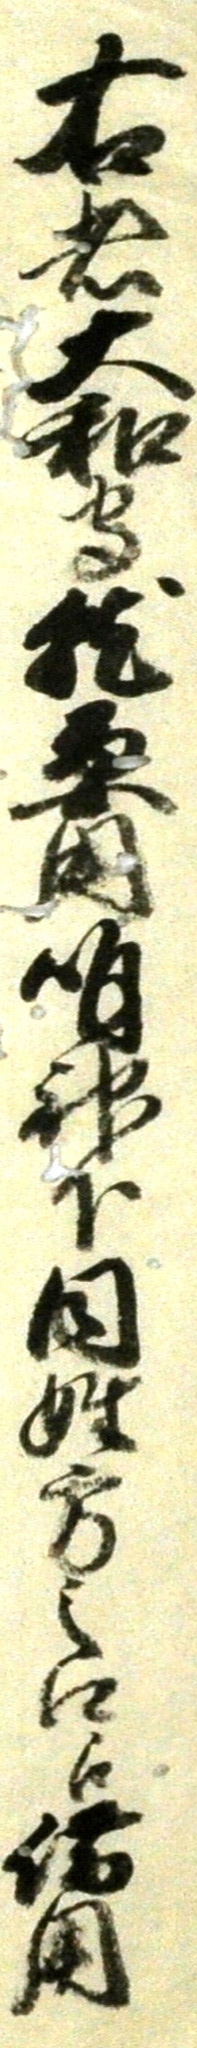右者大和守就要用明神下同姓方之口江借用
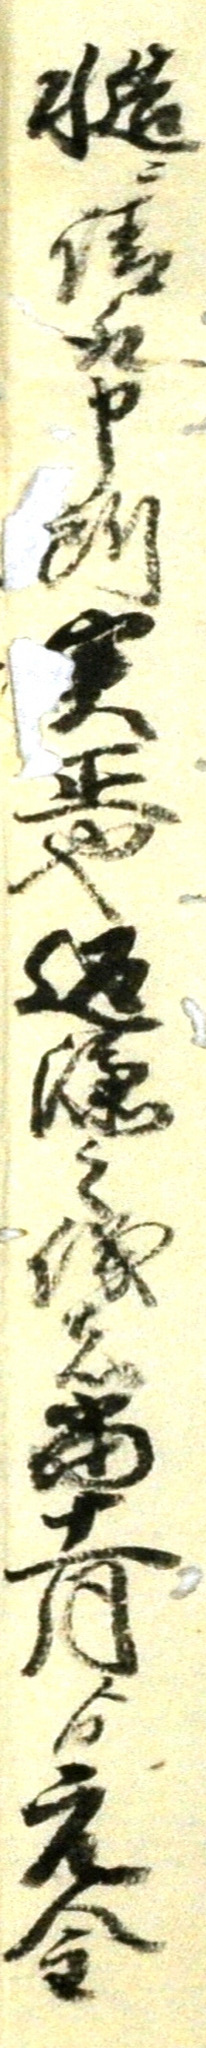慥ニ請取申所実正也返済之儀者当十一月ゟ元金
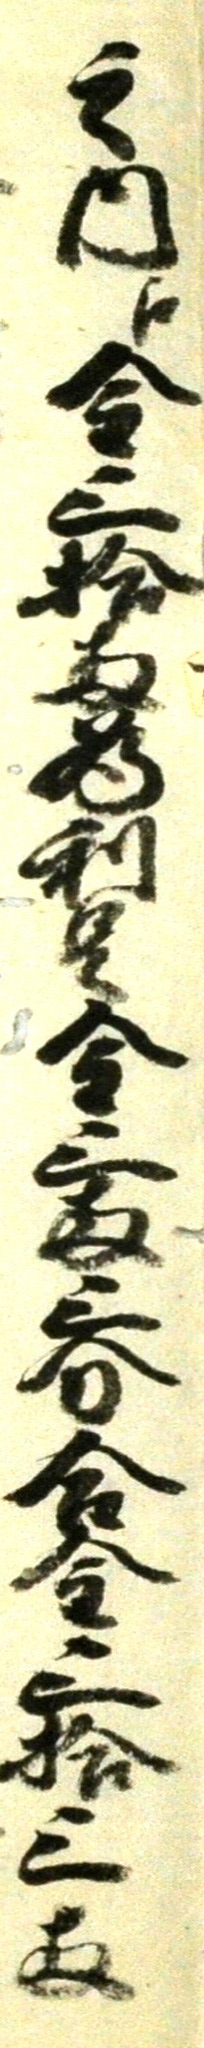之内江金三拾両為利足金三両三分合金三拾三両
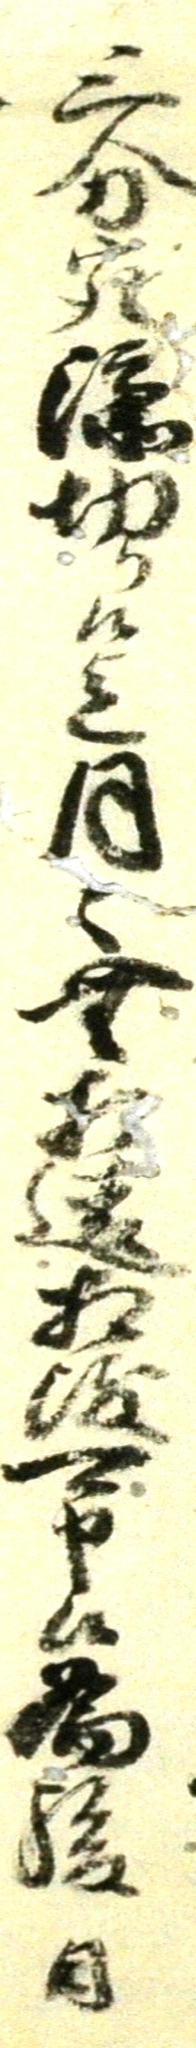三分宛済切り候迄月々無相違相渡可申候為後日
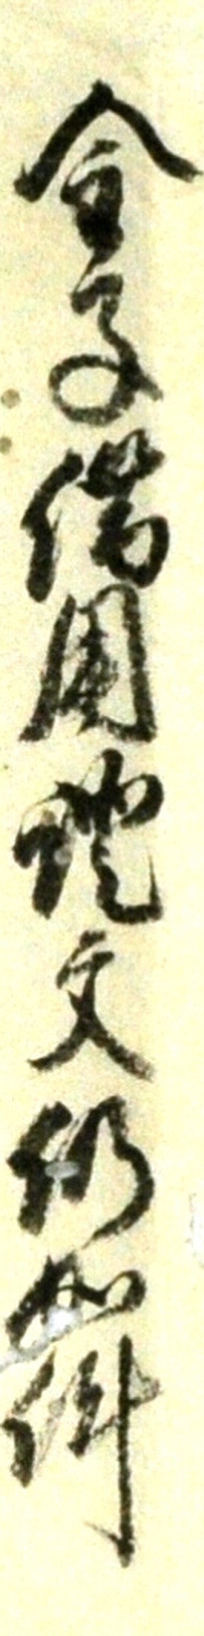金子借用証文仍如件
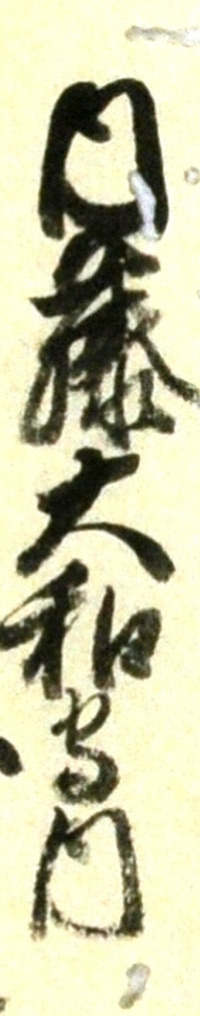内藤大和守内
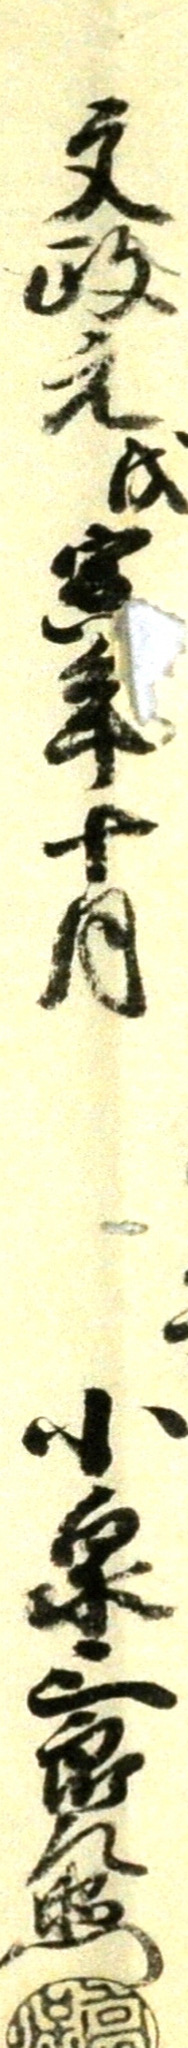文政元戊寅年十月小泉三郎左衛門㊞
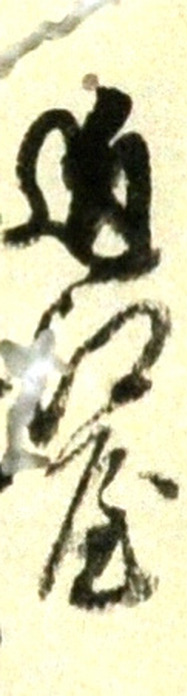近江屋
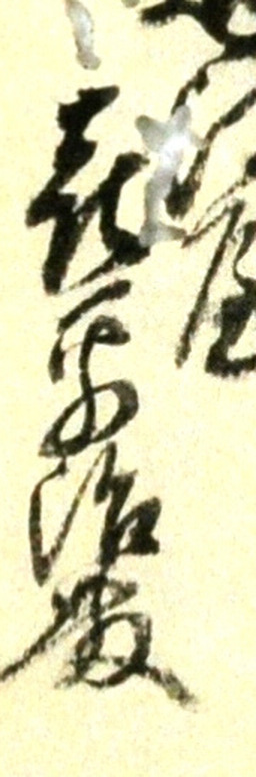喜平治殿
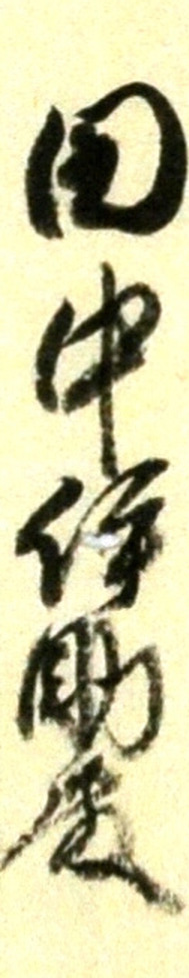田中伊助殿
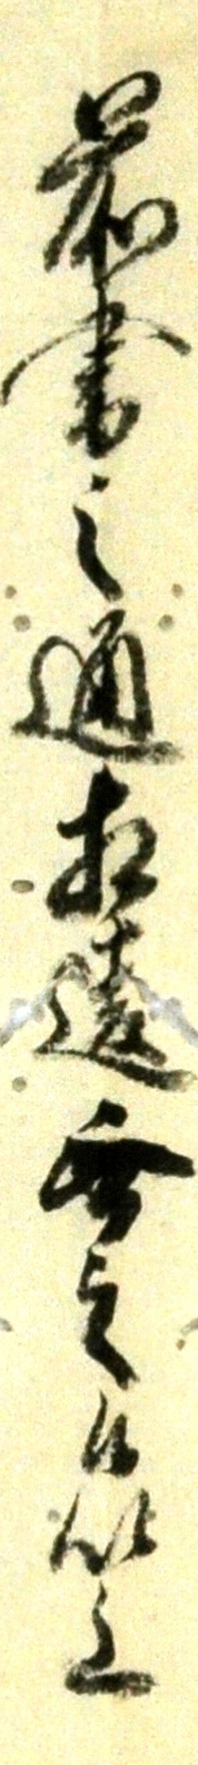前書之通相違無之候以上
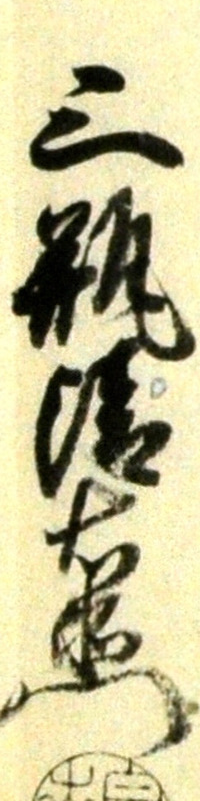三瓶清右衛門㊞
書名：借用申金子之事
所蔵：伊那市立高遠町図書館・合同会社AMANE
